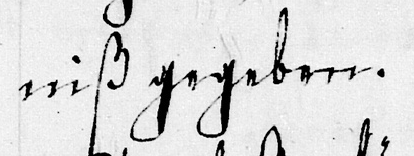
niß gegeben.
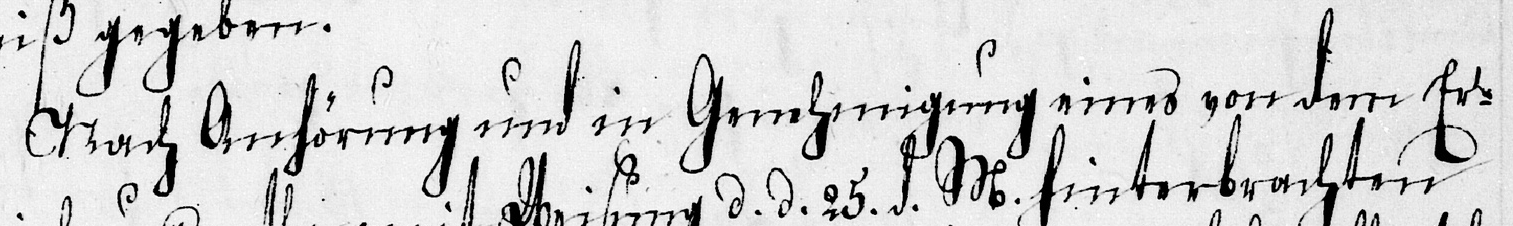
Nach Anhörung und Genehmigung eines von dem Er¬
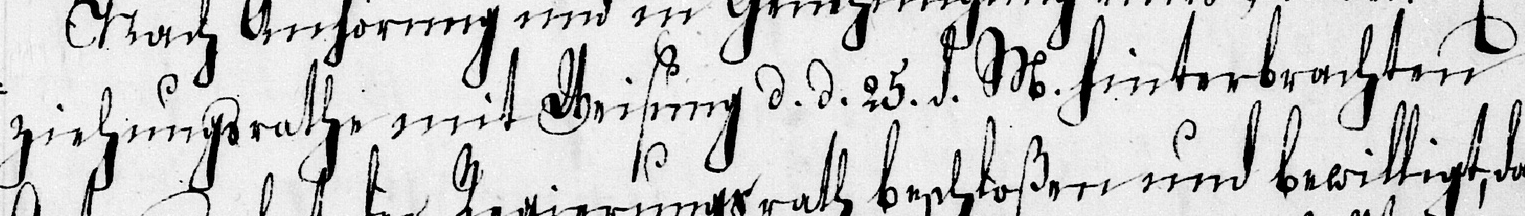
ziehungsrathe mit Weisung d. d. 25. d. M. hinterbrachten
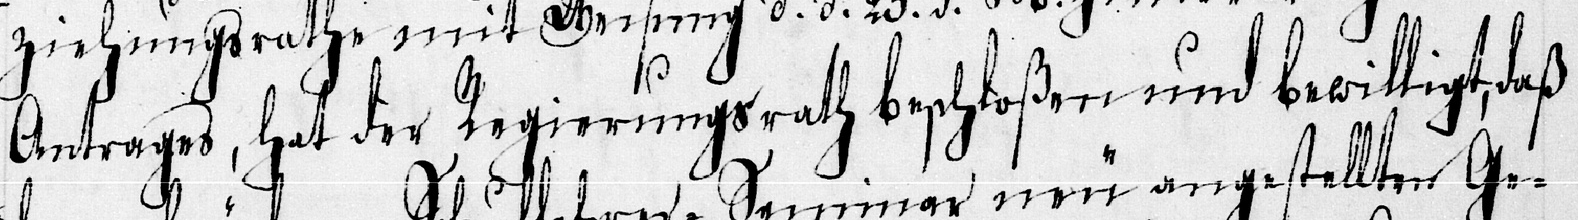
Antrages, hat der Regierungsrath beschloßen und bewilligt, daß
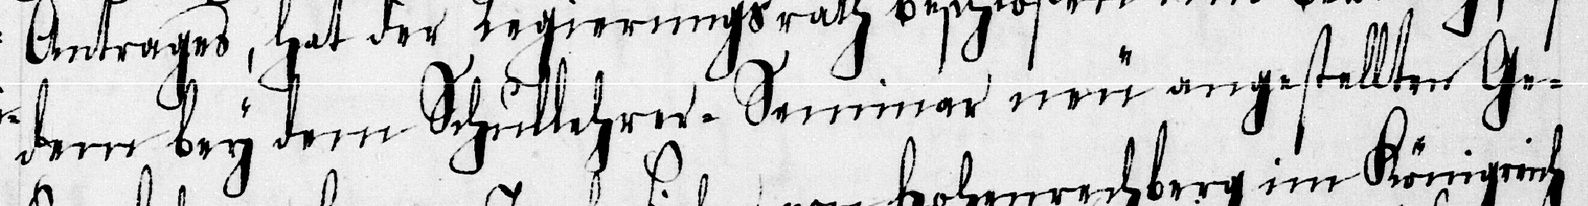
dem bey dem Schullehrer-Seminar neu angestellten Ge¬
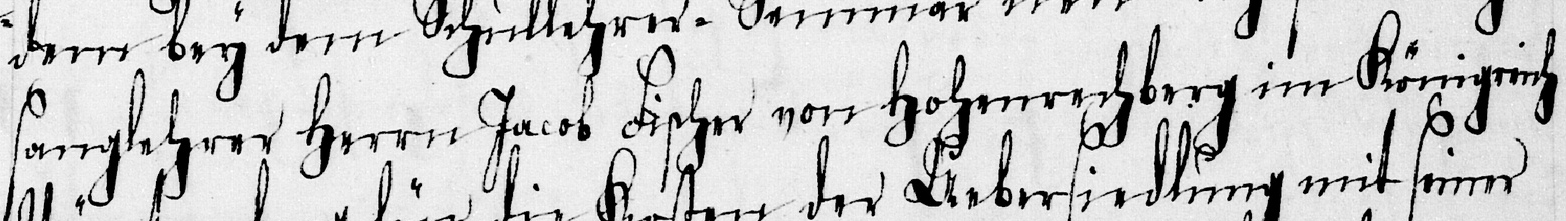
sanglehrer Herrn Jacob Fischer von Hohenrechberg im Königreich
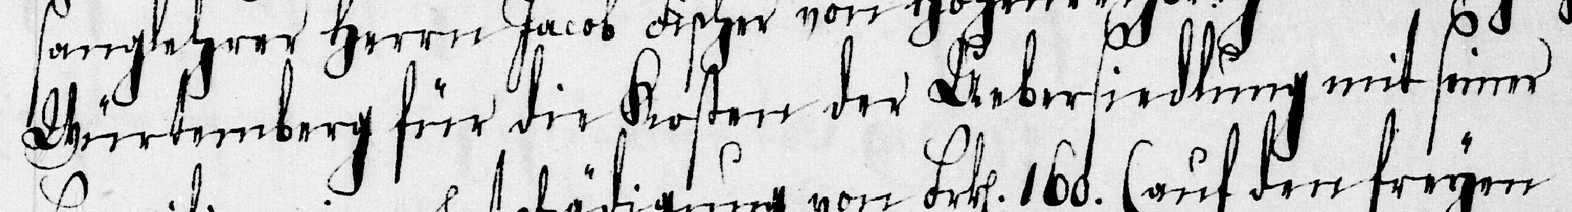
Würtemberg für die Kosten der Uebersiedlung mit seiner
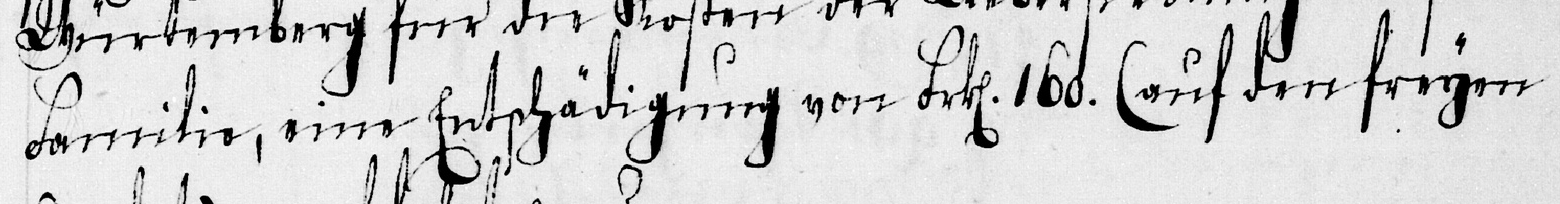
Familie, eine Entschädigung von Frk[en]. 160. (auf den freyen
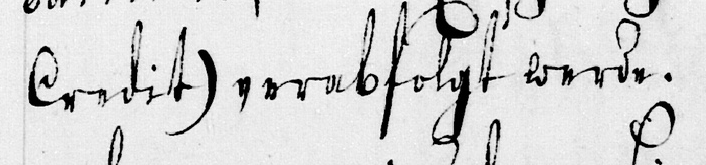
Credit) verabfolgt werde.
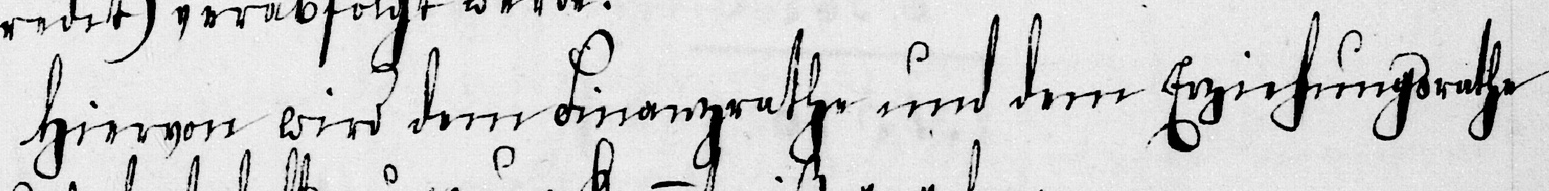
Hiervon wird dem Finanzrathe und dem Erziehungsrathe
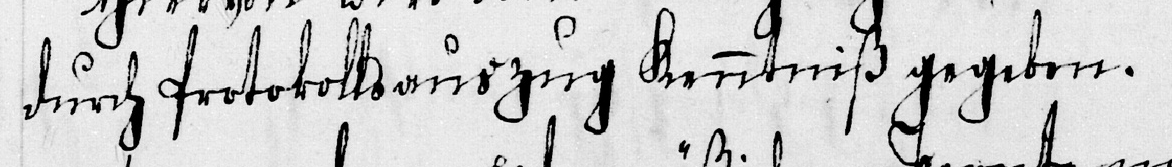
durch Protokollsauszug Kenntniß gegeben.
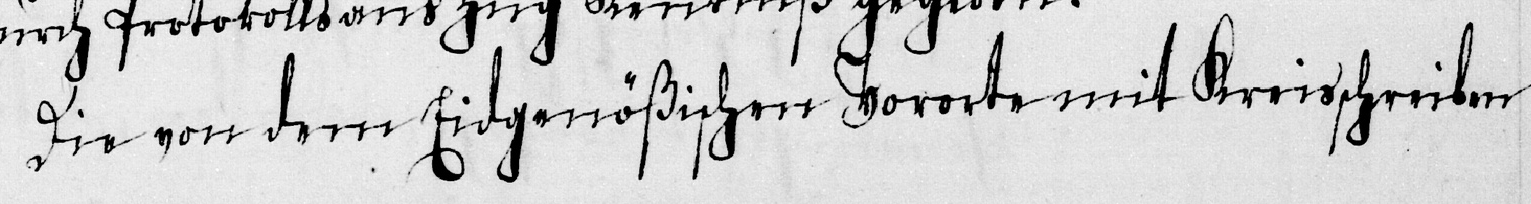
Die von dem Eidgenößischen Vororte mit Kreisschreiben
